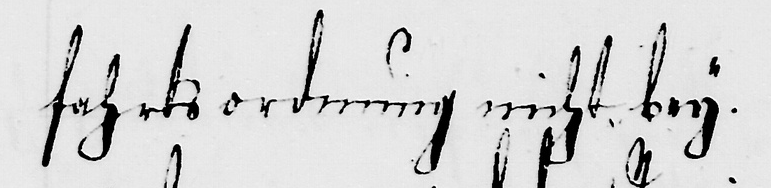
fahrtsordnung nicht bey.
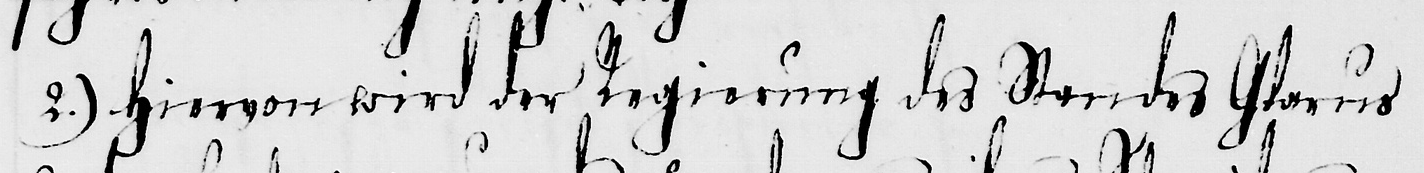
2.) Hiervon wird der Regierung des Standes Glarus
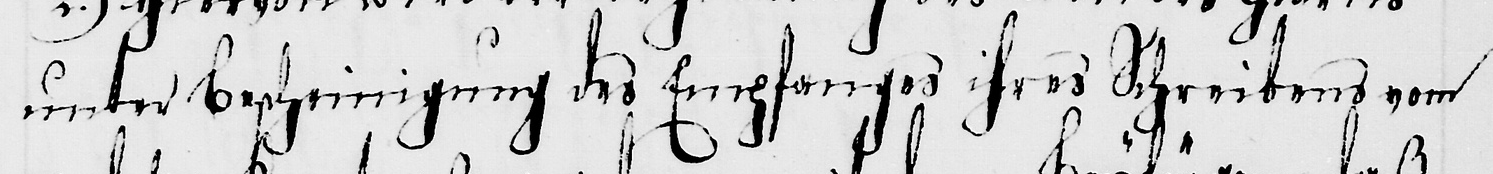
unter Bescheinigung des Empfanges ihres Schreibens vom
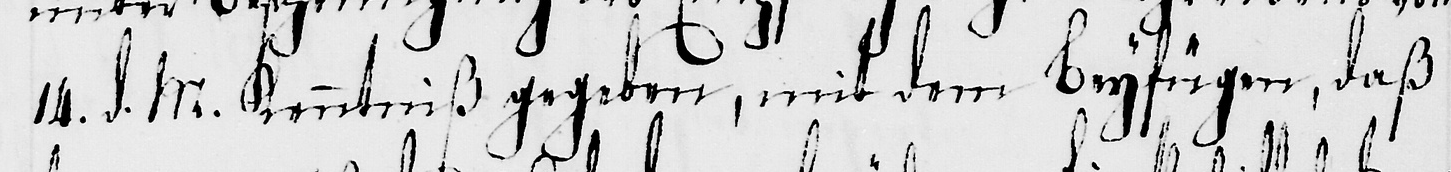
14. d. M. Kenntniß gegeben, mit dem Beyfügen, daß
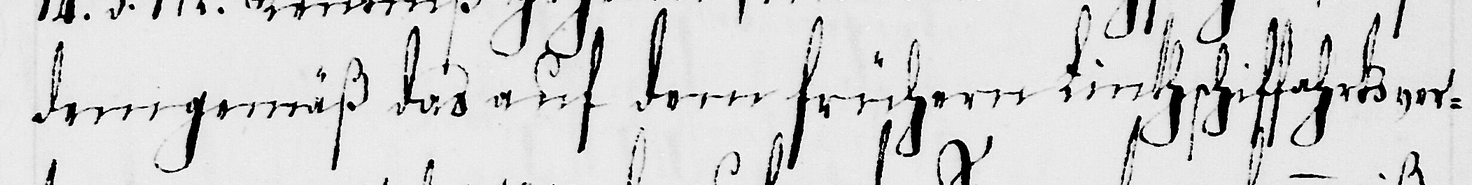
demgemäß das auf dem frühern Linthschiffahrtsve¬
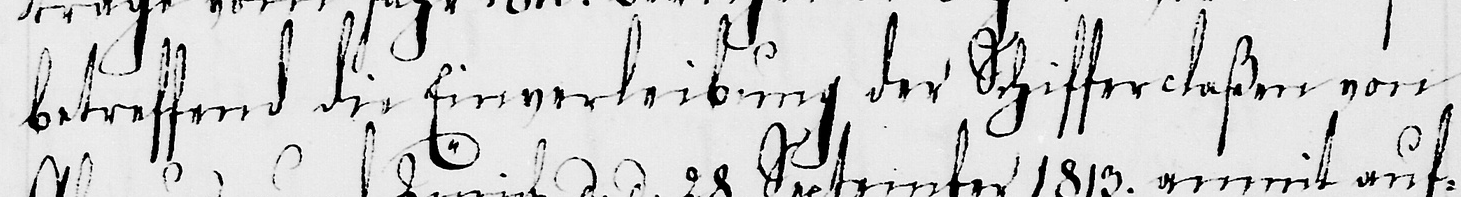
betreffend die Einverleibung der Schifferclaßen von
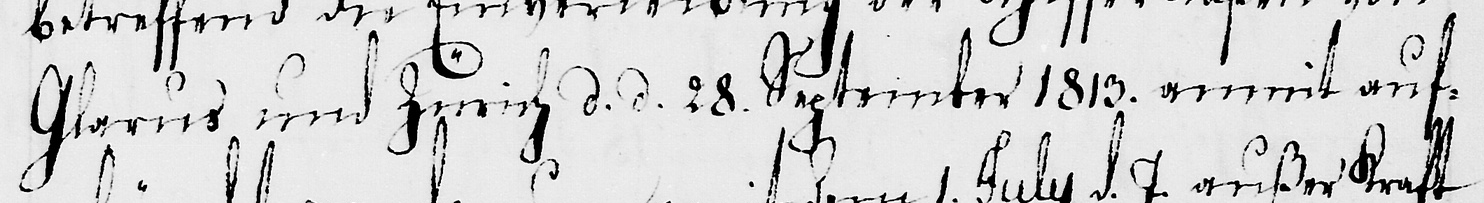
Glarus und Zürich d. d. 28. September 1813. anmit auf¬
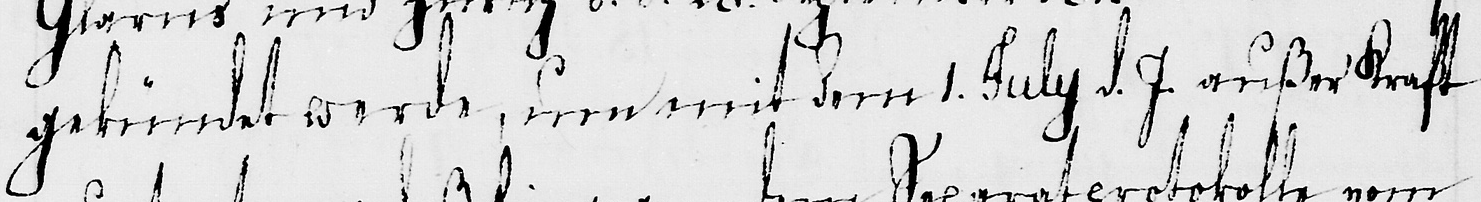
gekündet werde, um mit dem 1. July d. J. außer Kraft
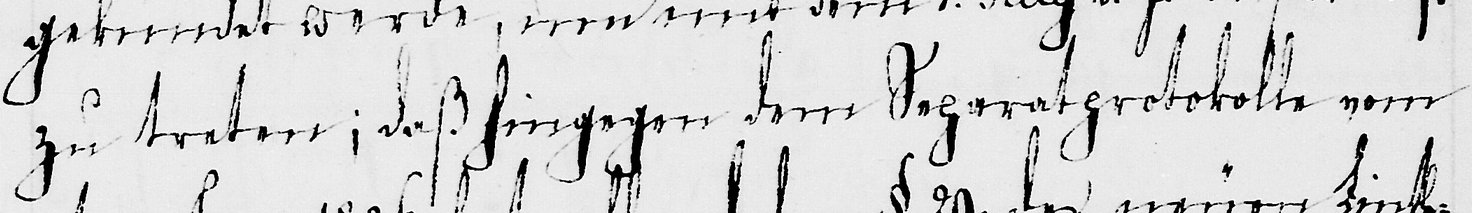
zu treten; daß hingegen dem Separatprotokolle vom
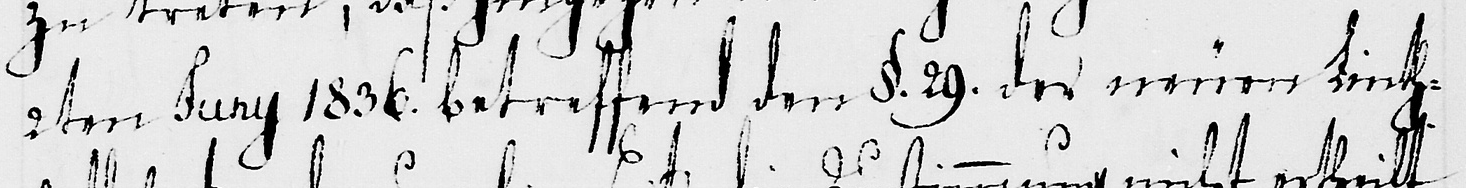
2ten Juny 1836. betreffend den §. 29. der neuen Linths¬
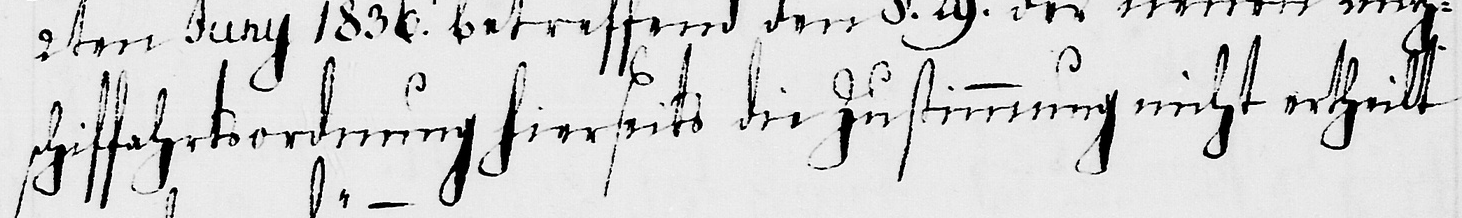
chiffahrtsordnung hierseits die Zustimmung nicht ertheilt
